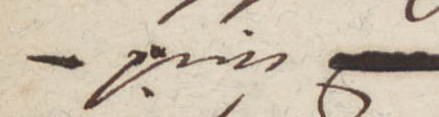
tionen verdrängt hatte oder
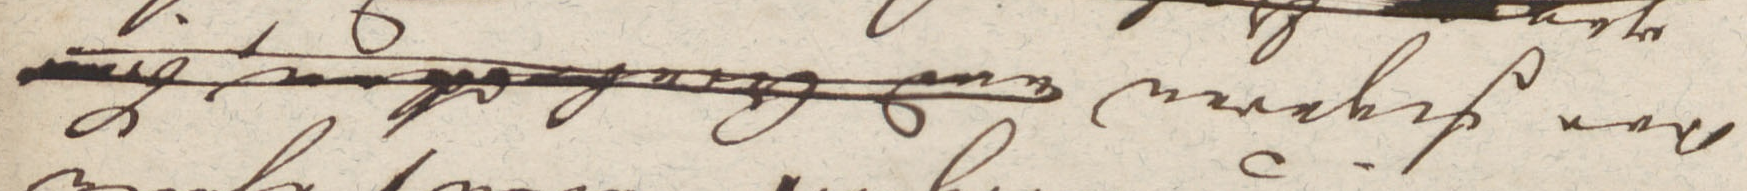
eine spätere Technik Spätere noch nicht Zeit
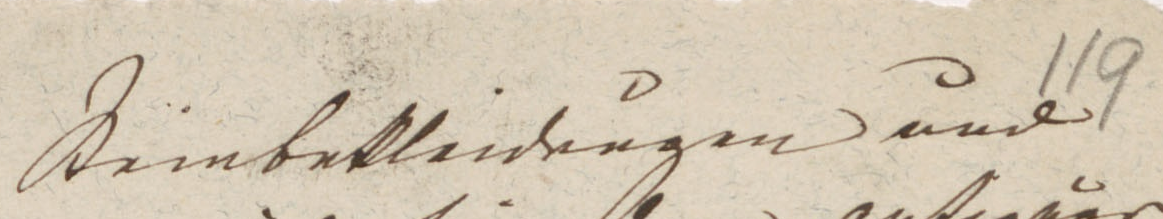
Steinbekleidungen und
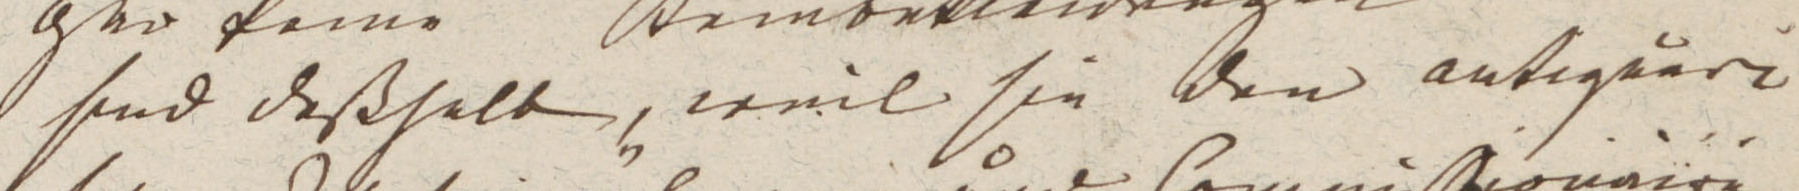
sind desshalb, weil sie den antquari
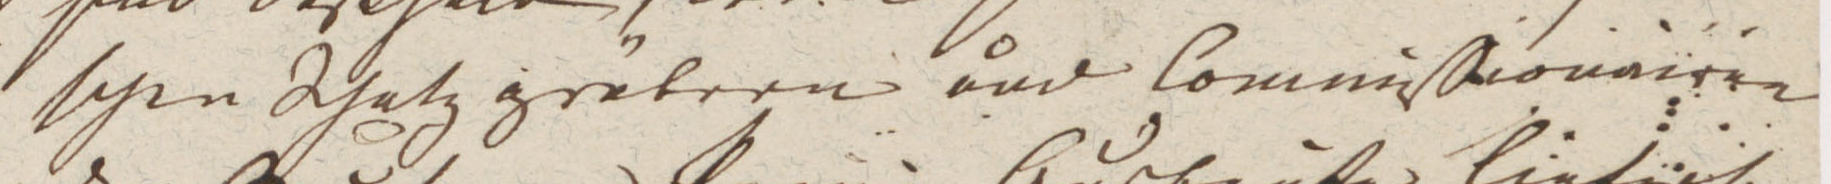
schen Schatzgräbern und Commissionairen
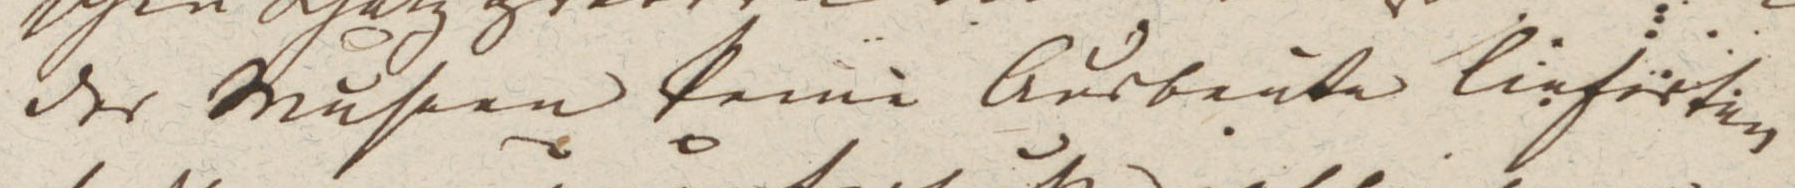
der Museen keine Ausbeute lieferten
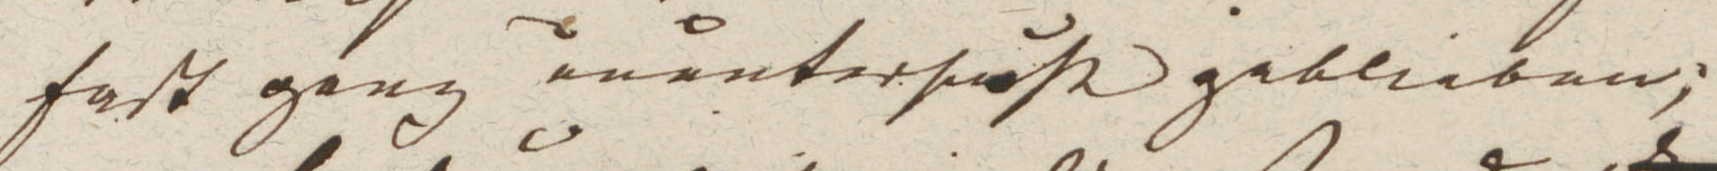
fast ganz ununtersucht geblieben;
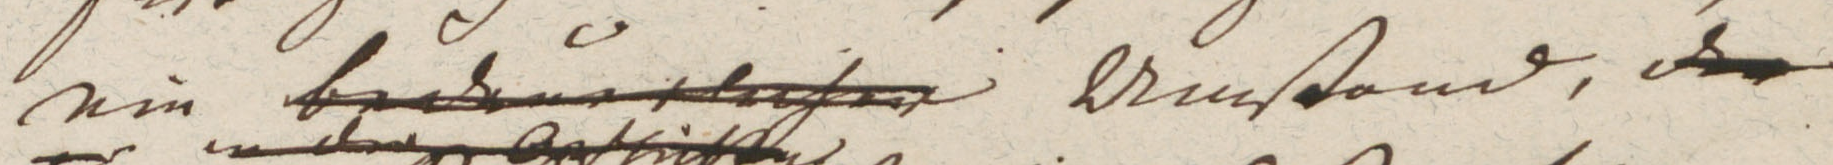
ein bedauerlicher Umstand, der
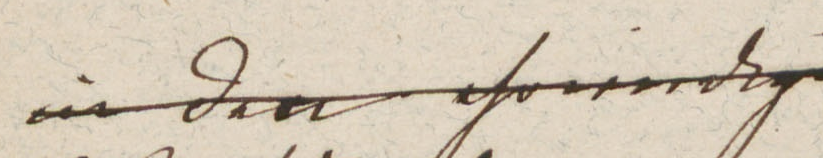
in den ehrwürdigen
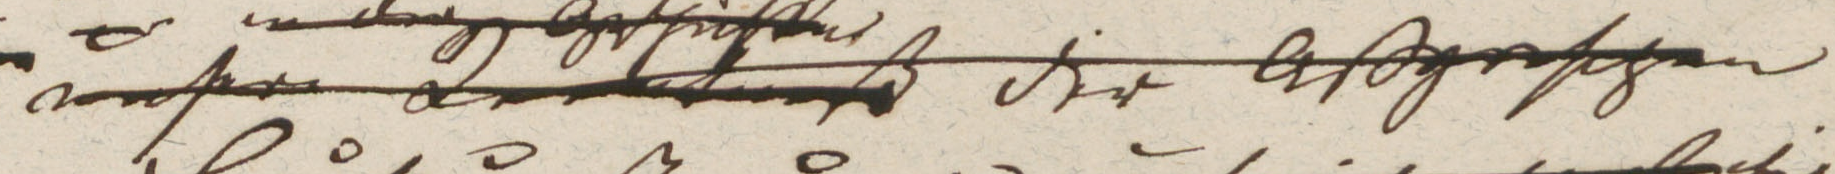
unsere Kenntniss der Assyrischen
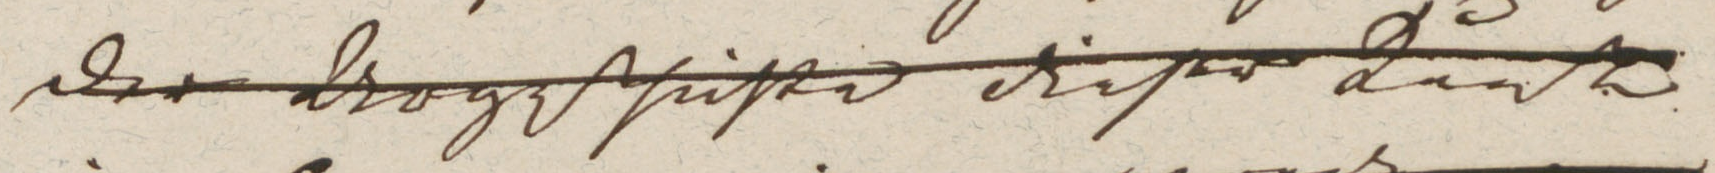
der Urgeschichte dieser Kunst
